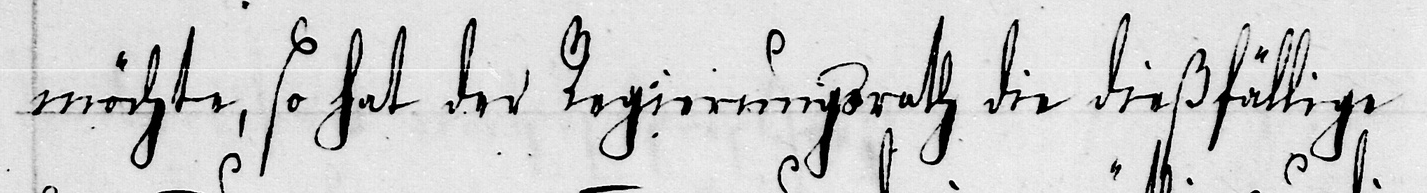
möchte, so hat der Regierungsrath die dießfällige
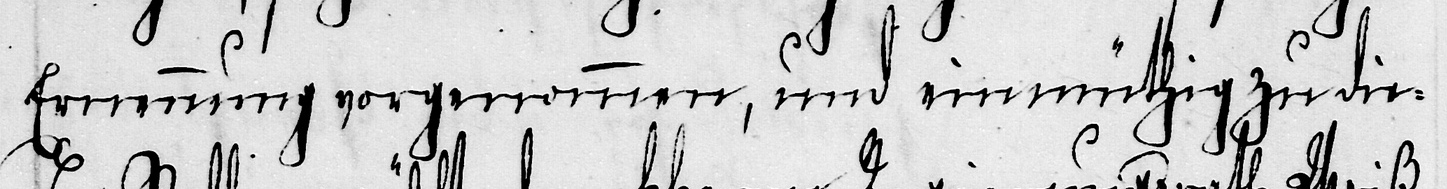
Ernennung vorgenommen, und einmüthig zu die¬
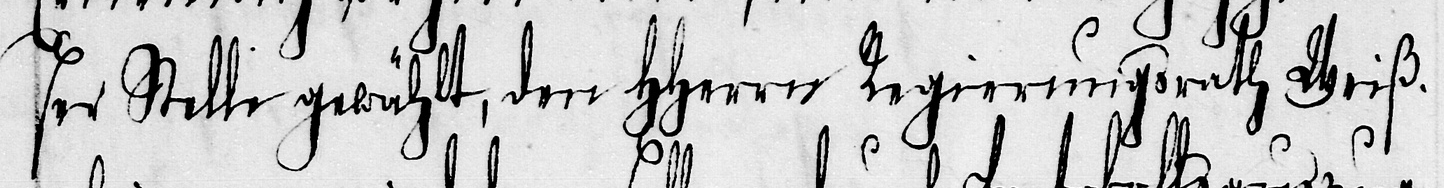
ser Stelle gewählt, den HHerrn Regierungsrath Weiß.
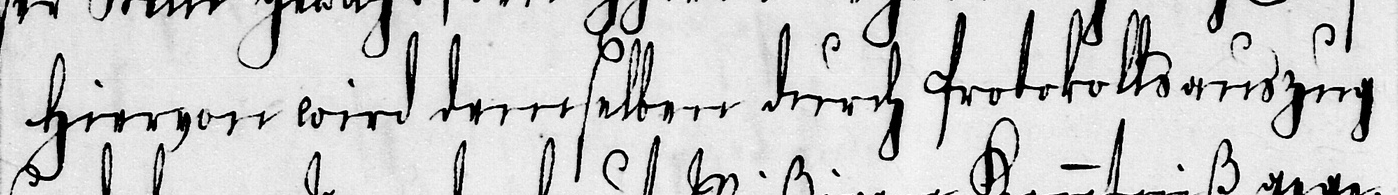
Hiervon wird demselben durch Protokollsauszug
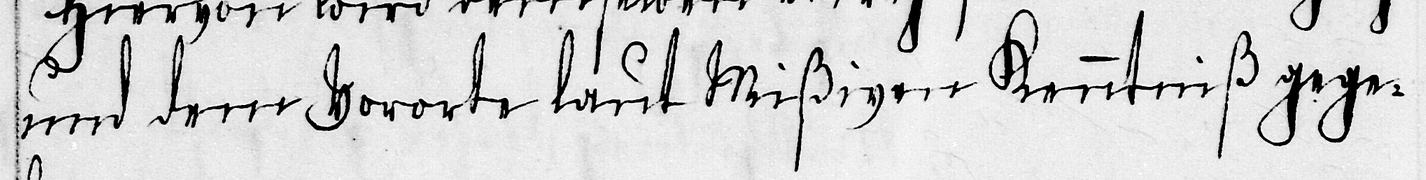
und dem Vororte laut Mißiven Kenntniß gege¬
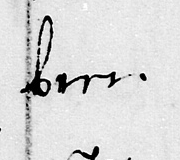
ben.
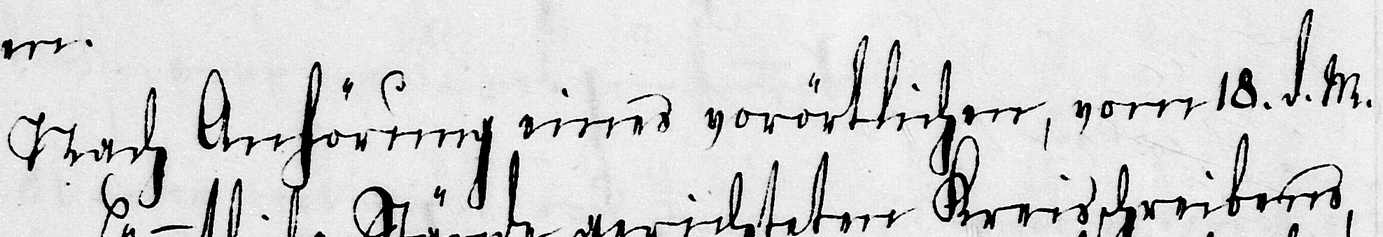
Nach Anhörung eines vorörtlichen, vom 18. d. M.
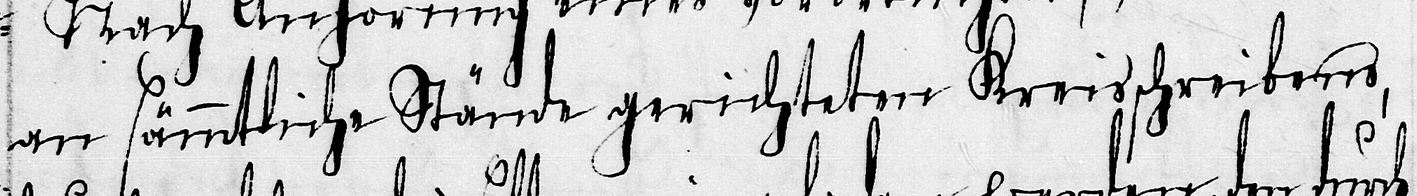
an sämmtliche Stände gerichteten Kreisschreibens,
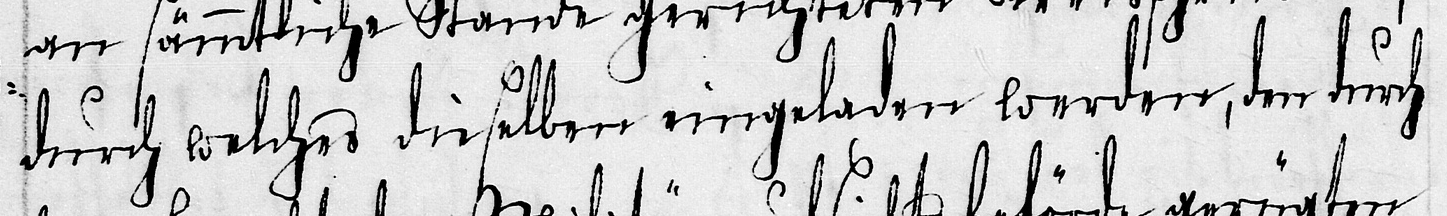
durch welches dieselben eingeladen werden, den durch
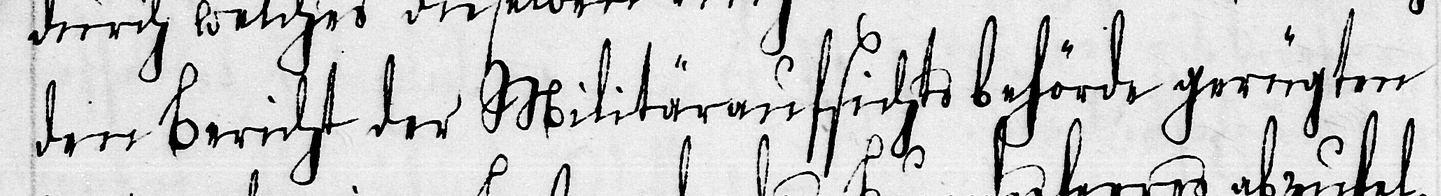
den Bericht der Militäraufsichtsbehörde gerügten
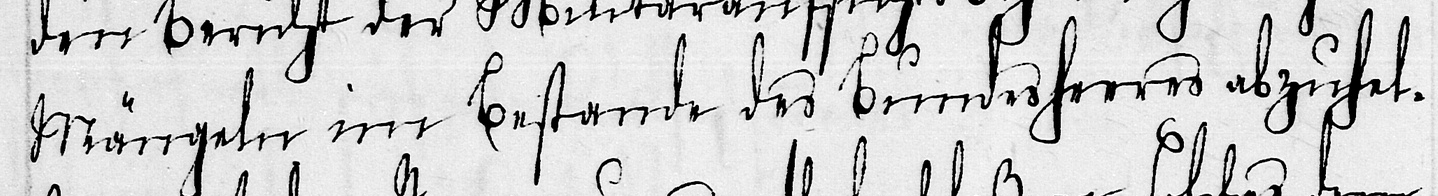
Mängeln im Bestande des Bundesheeres abzuhel¬
